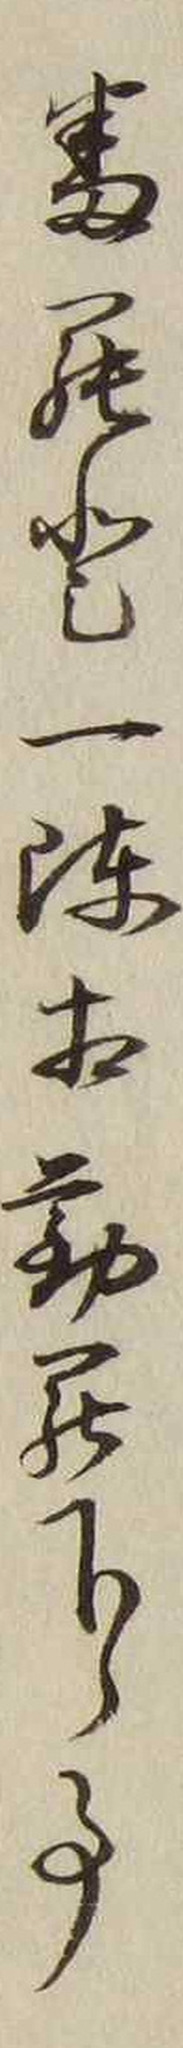番罷登一陣相勤罷下候事

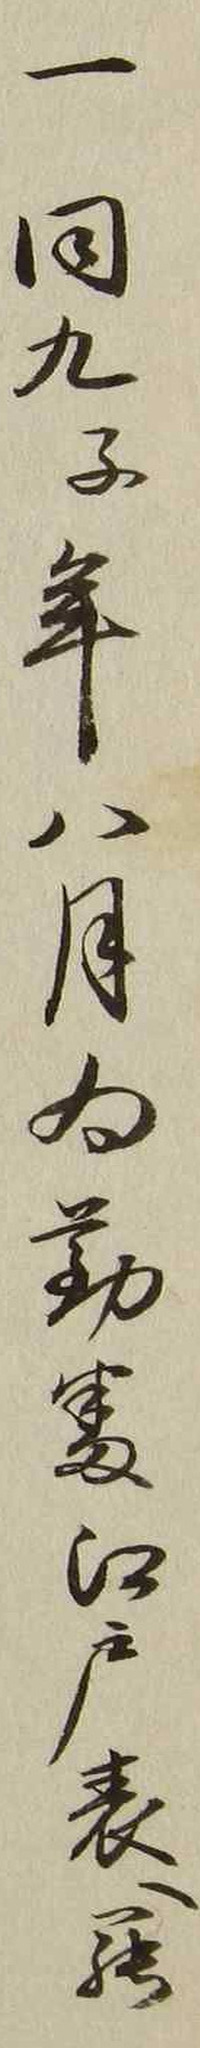一同九子年八月為勤番江戸表へ罷
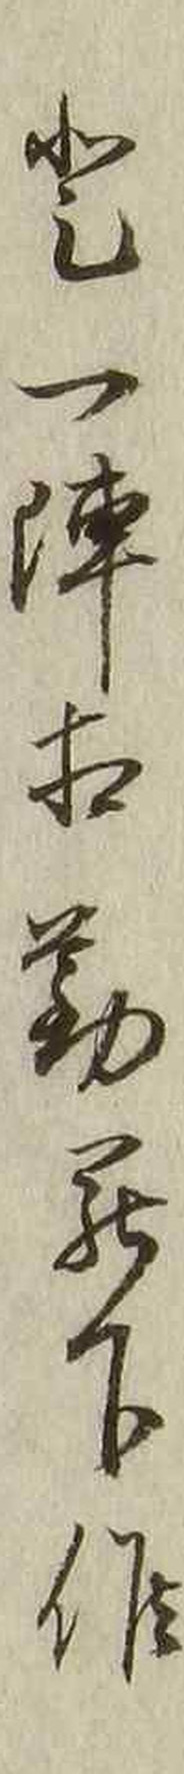登一陣相勤罷下候
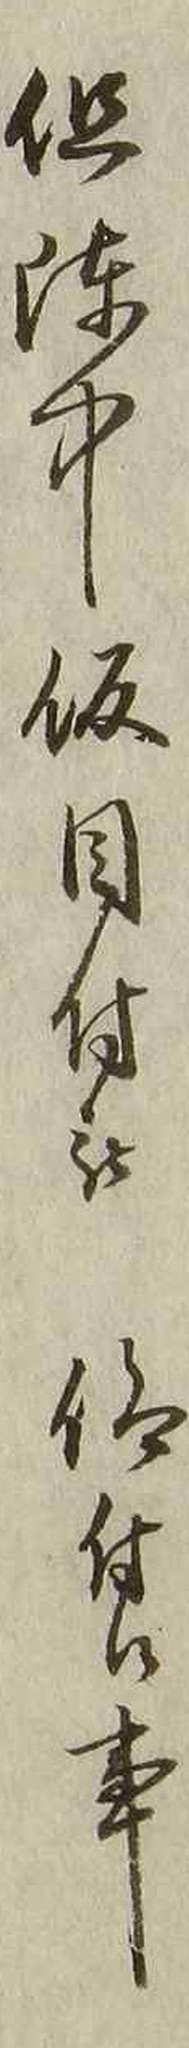但陣中仮目付被仰付候事
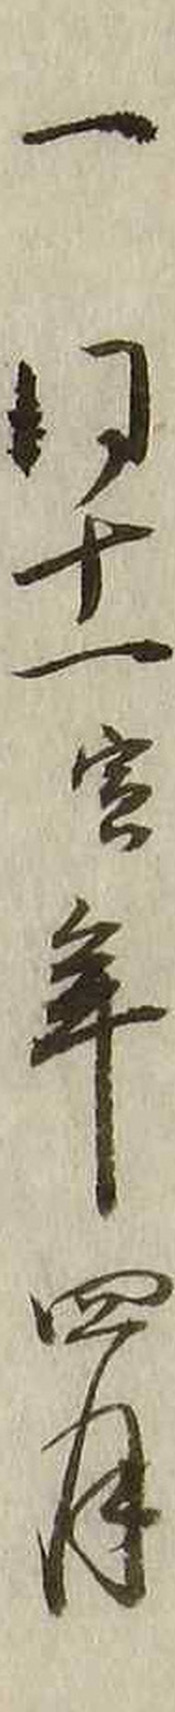一同十一寅年四月
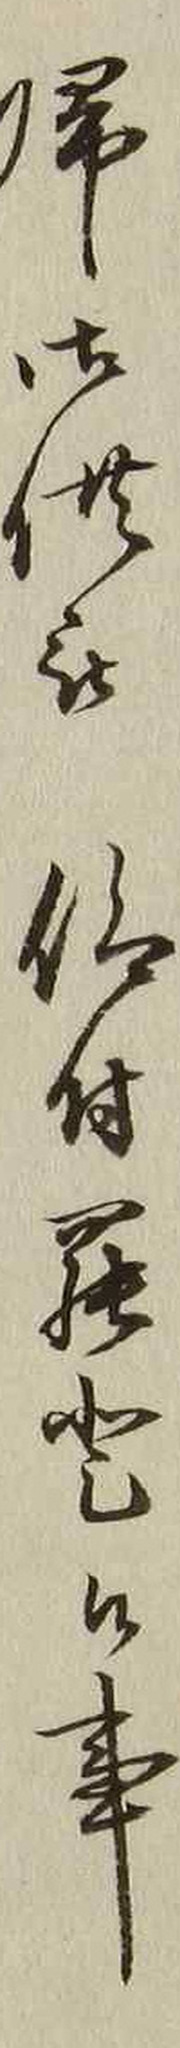帰御供被仰付罷登候事
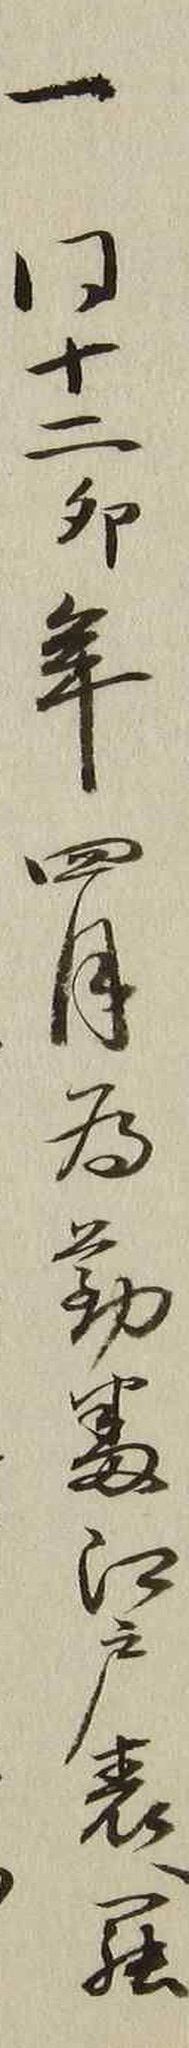一同十二卯年四月為勤番江戸表へ罷
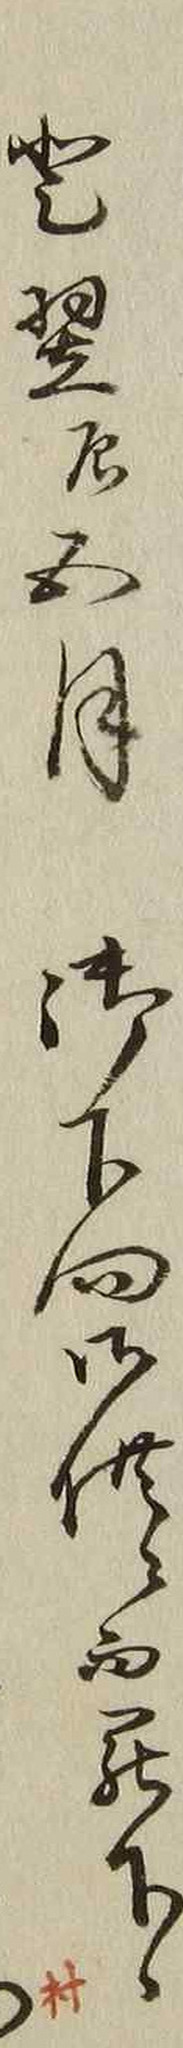登翌辰五月御下向御供ニ而罷下候
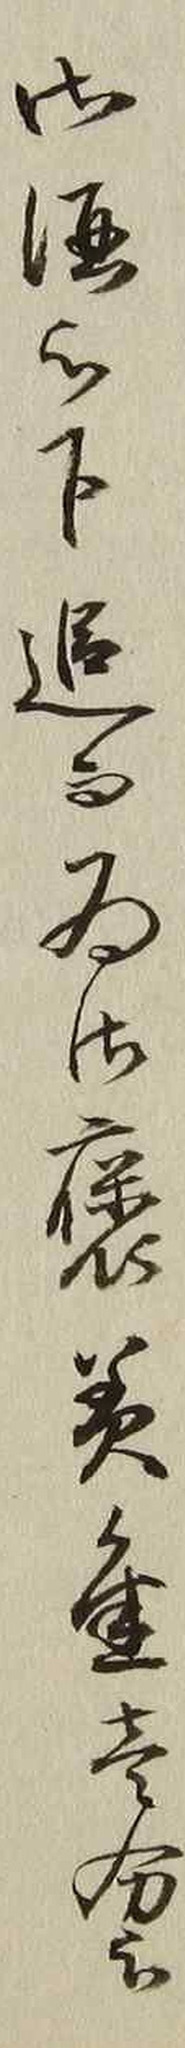御酒被下追而為御褒美金壱分被
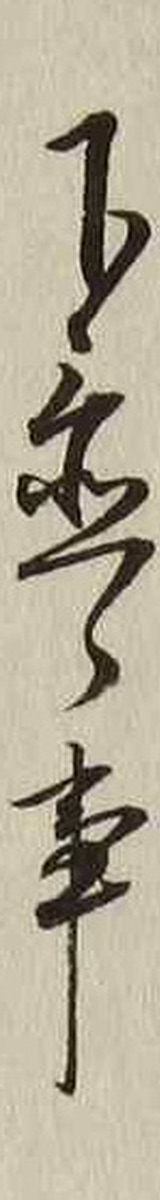下置候事
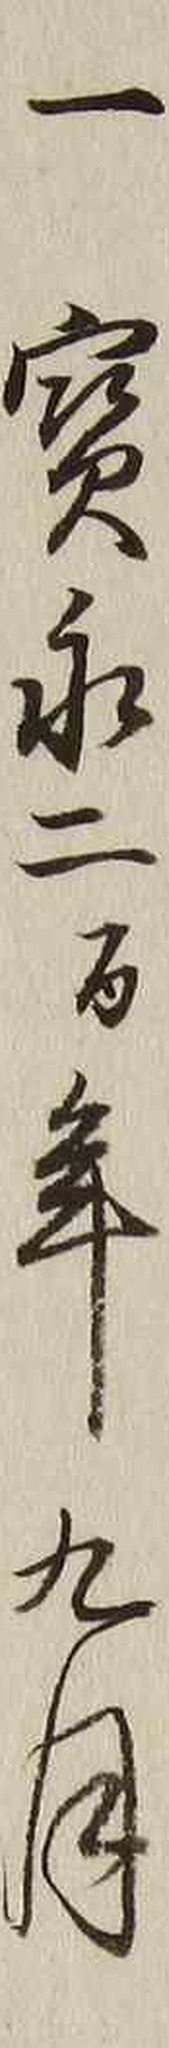一宝永二酉年九月
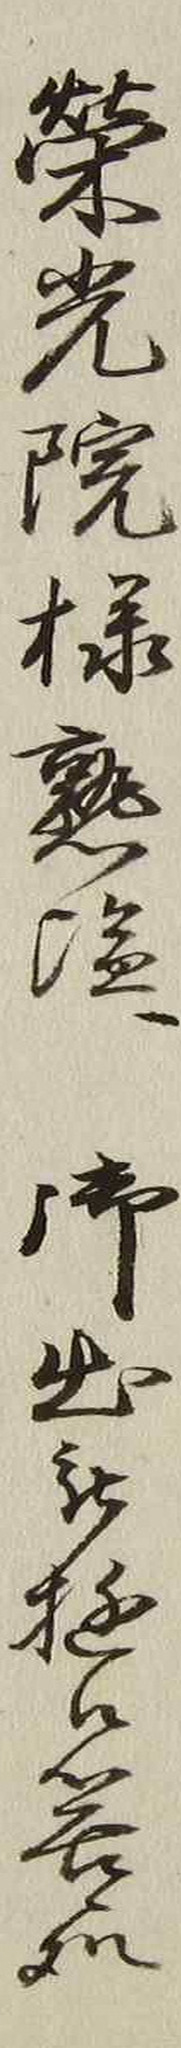栄光院様熟塩へ御出被遊候筈候処
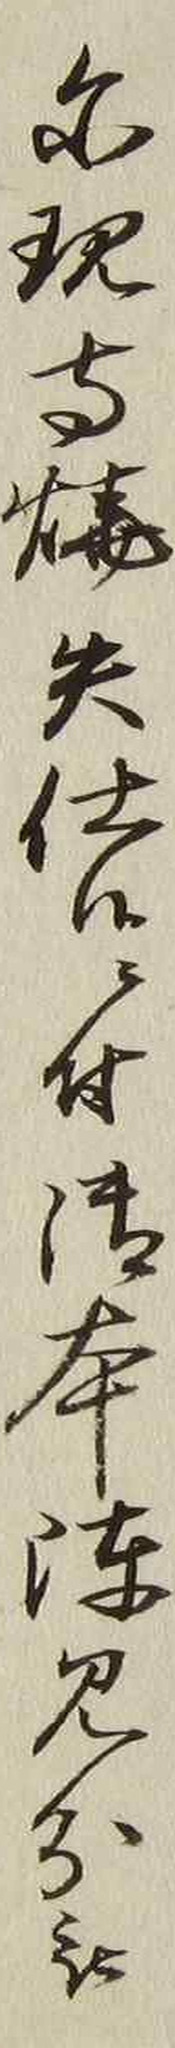示現寺焼失仕候ニ付御本陣見分被
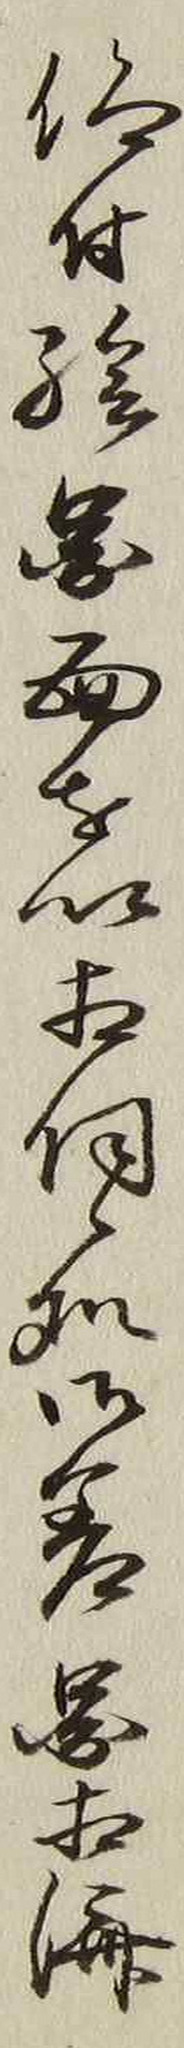仰付絵図面を以相伺候処御差図相済
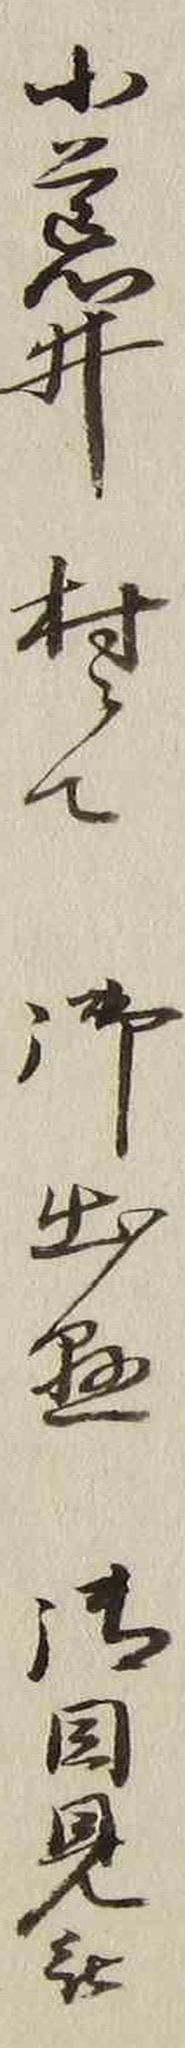小荒井村ニて御出懸御目見被
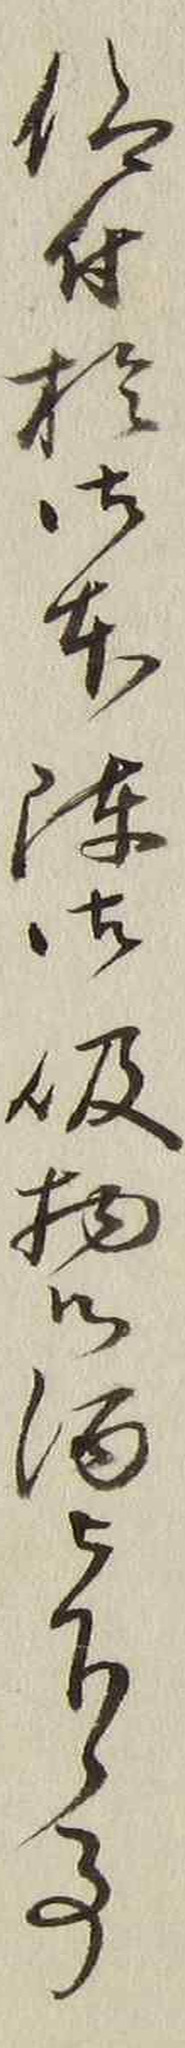仰付於御本陣御吸物御酒被下候事
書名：諸士系譜　巻之102　か之部10
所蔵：会津若松市立会津図書館
